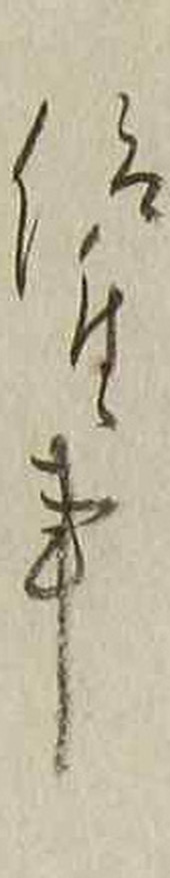仰付候事
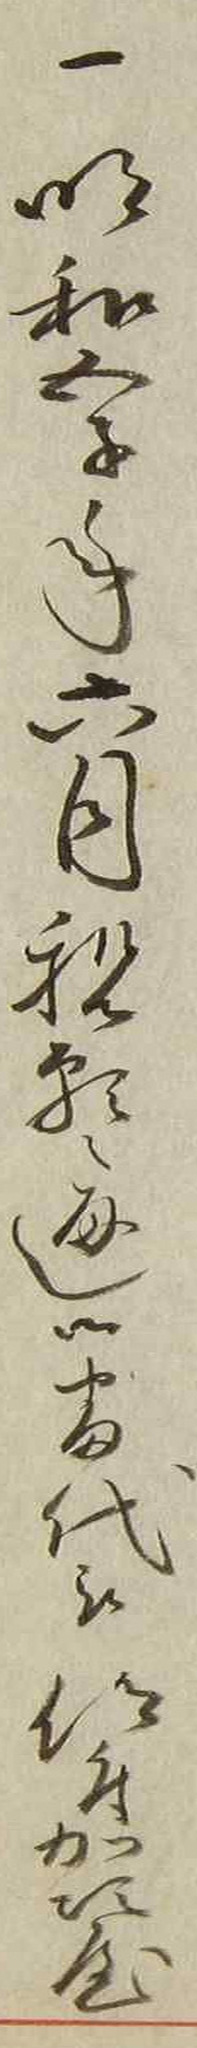一明和五子年六月親願之通御番代被仰付加須屋

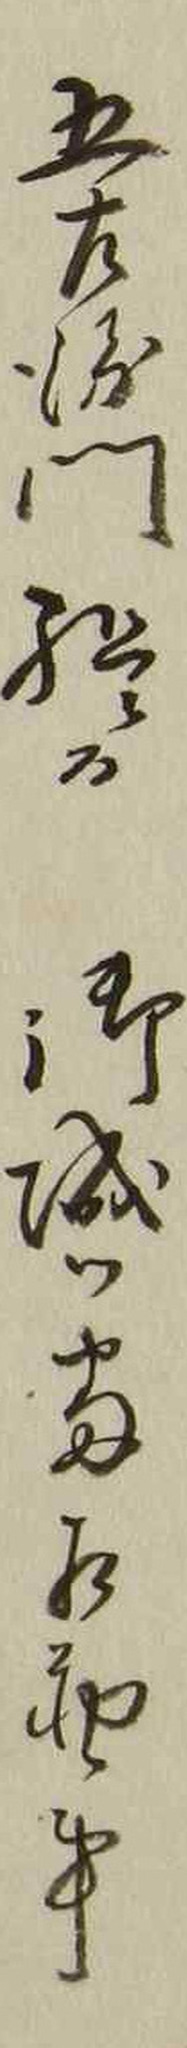五左衛門組に而御城御番相勤候事
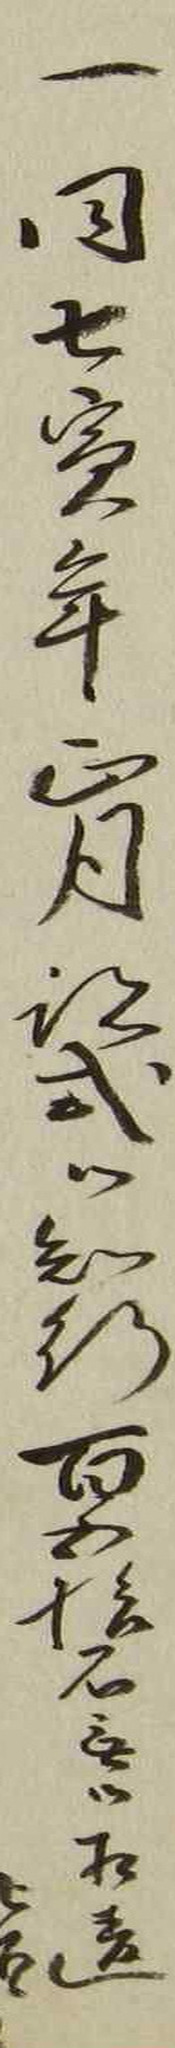一同七寅年正月跡式御知行百五拾石無御相違被下置候事
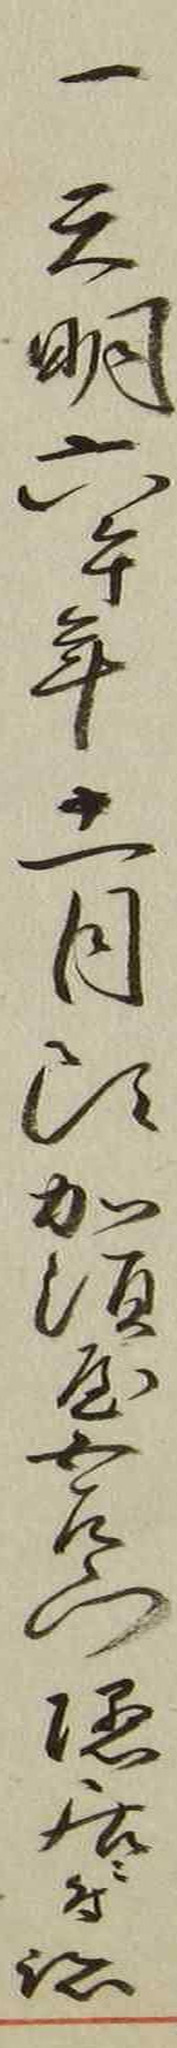一天明六午年十一月頭加須屋五左衛門隠居に付跡
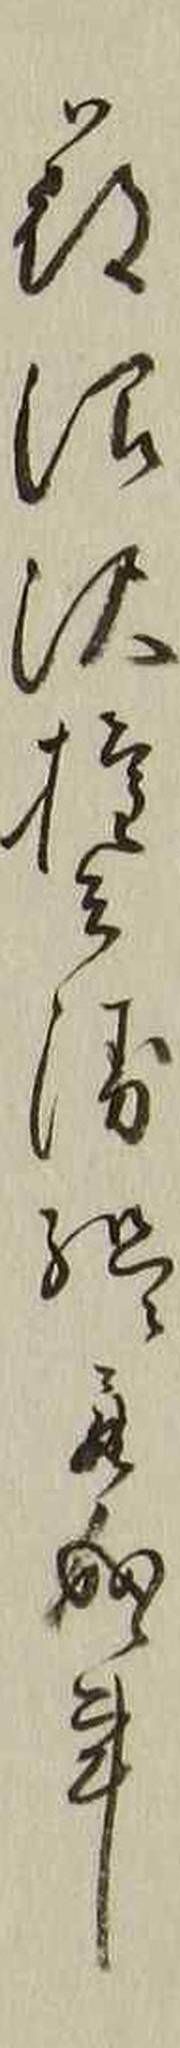御役沼沢権兵衛組に罷成候事
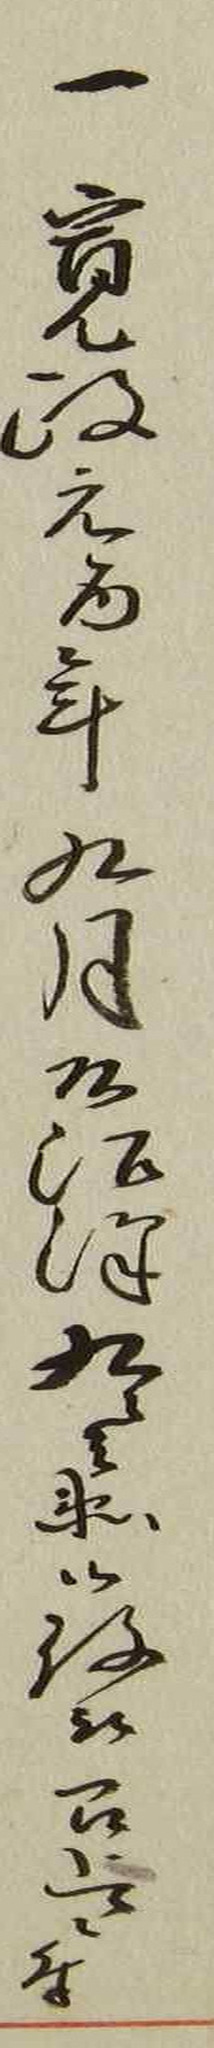一寛政元酉年九月頭沼沢九兵衛御役被召上候に付
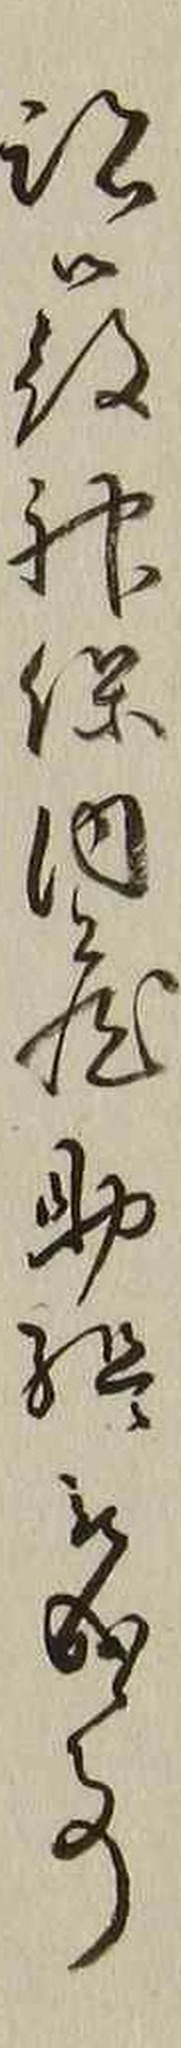跡御役神保内蔵助組に被成候事
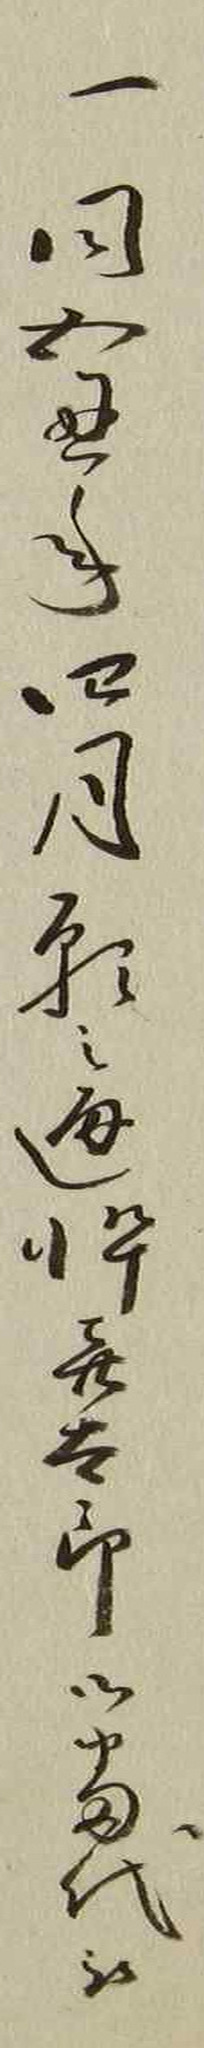一同五丑年四月願之通忰喜太郎御番代被
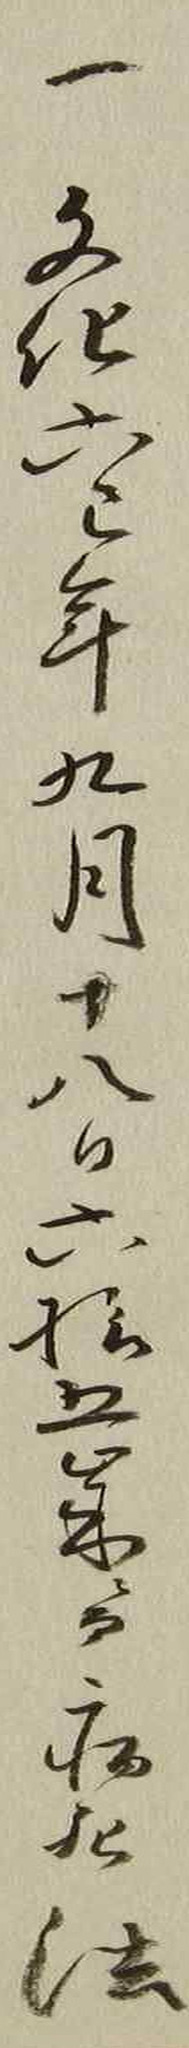一文化六巳年九月十八日六拾五歳に而病死法
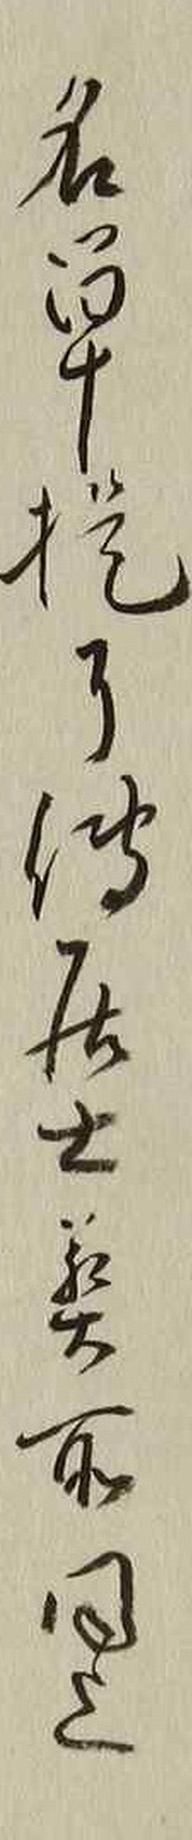名単提耳傳居士葬所同上
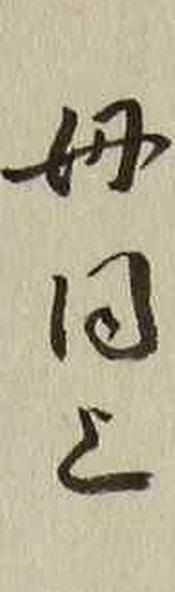母同上
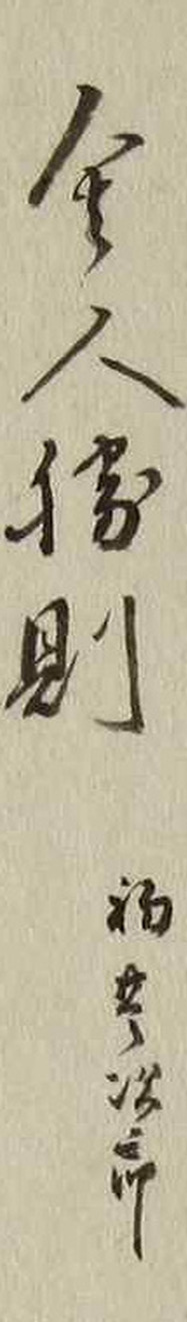舎人勝則初次郎
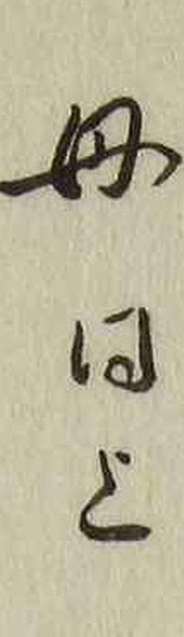母同上
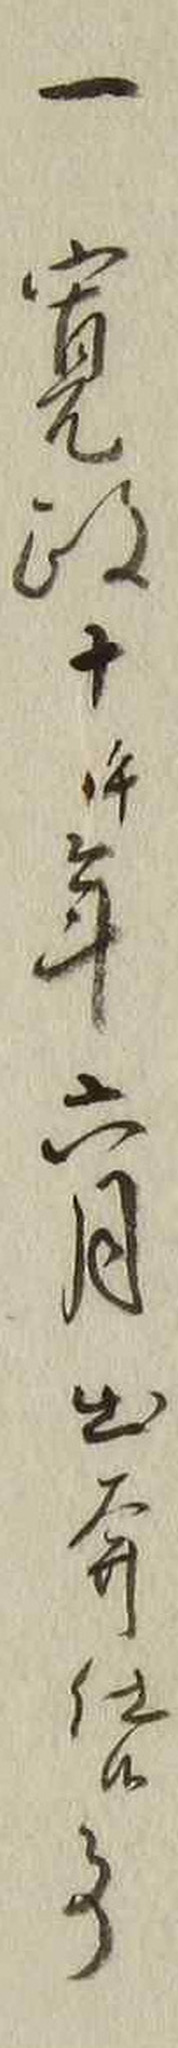一寛政十午年六月出奔仕候事
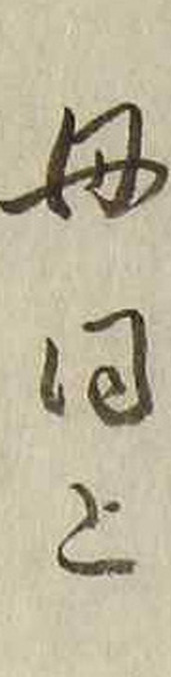母同上
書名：諸士系譜　巻之6　い之部6
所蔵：会津若松市立会津図書館
